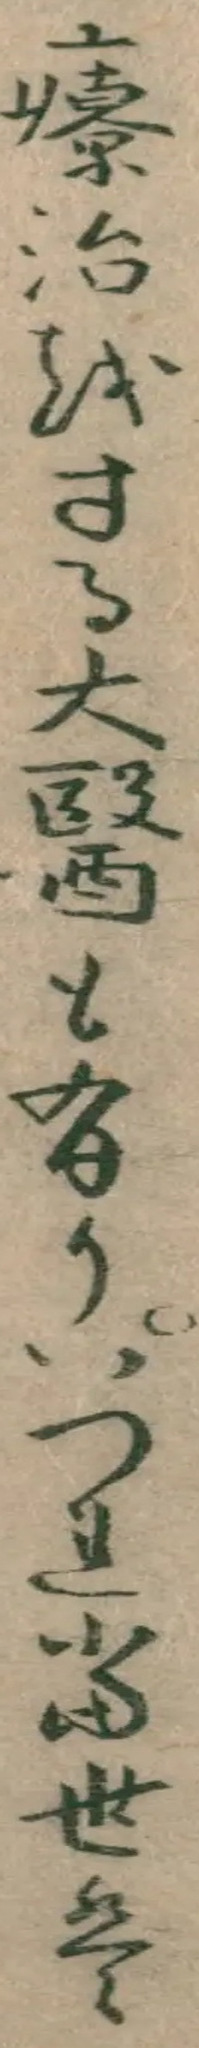療治をする大医も有り。いつれ当世は
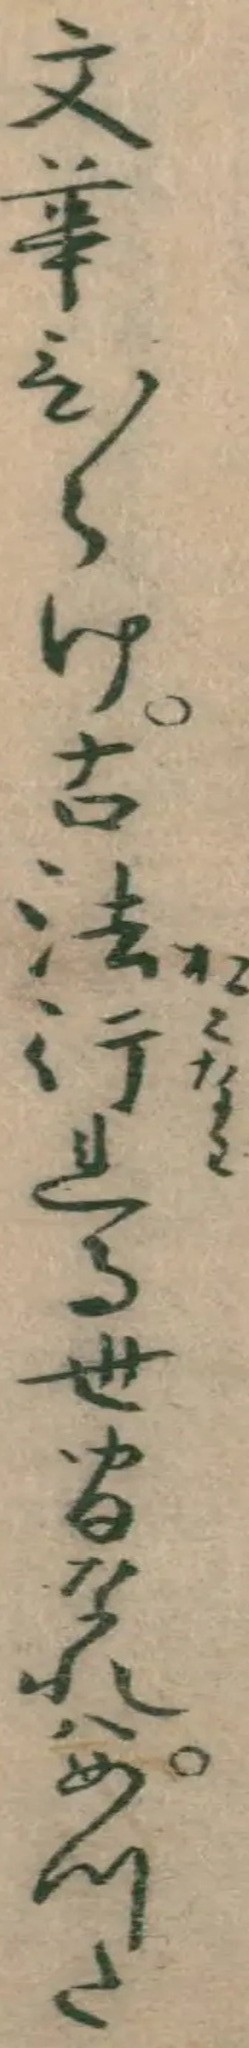文筆ひらけ。古法行れる世間なれは。めつた
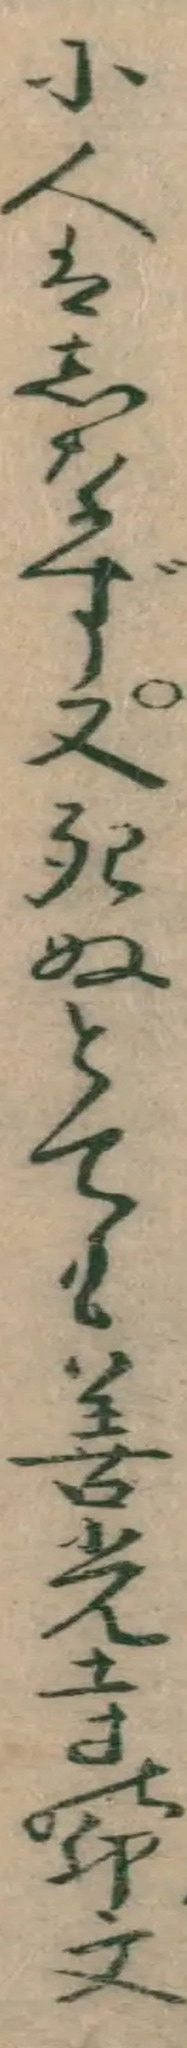に人はしなず。又死ぬとても善光寺の印文
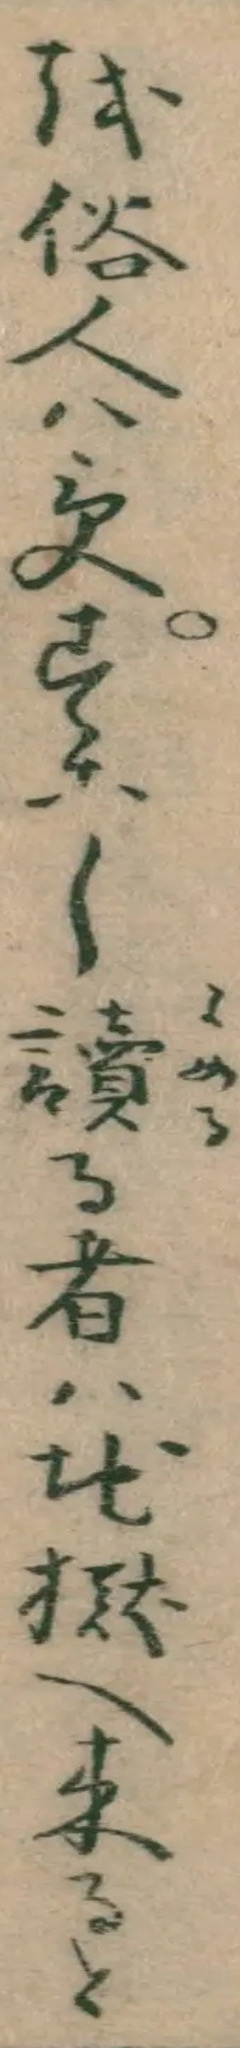を俗人は受。すこし読る者は地獄へ来ると
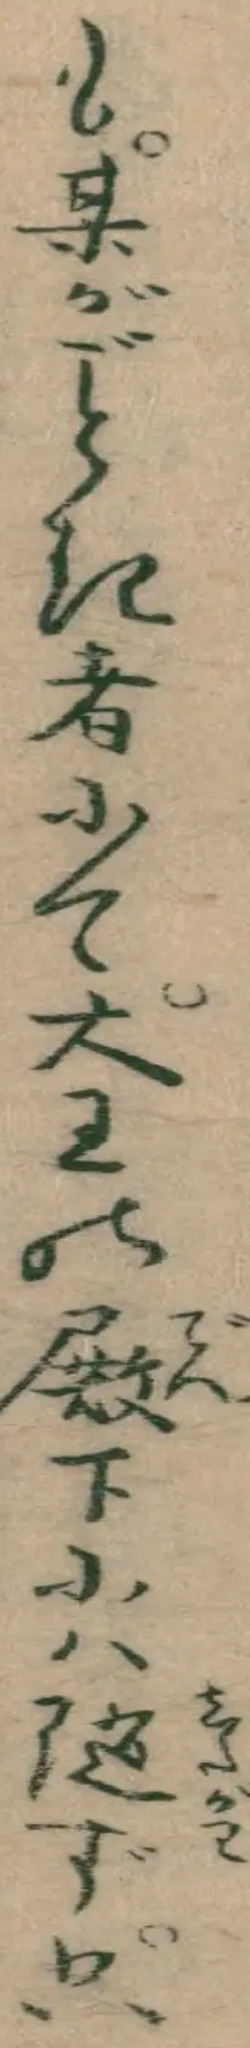も。某がごとき者にて。大王の殿下には随ず。只
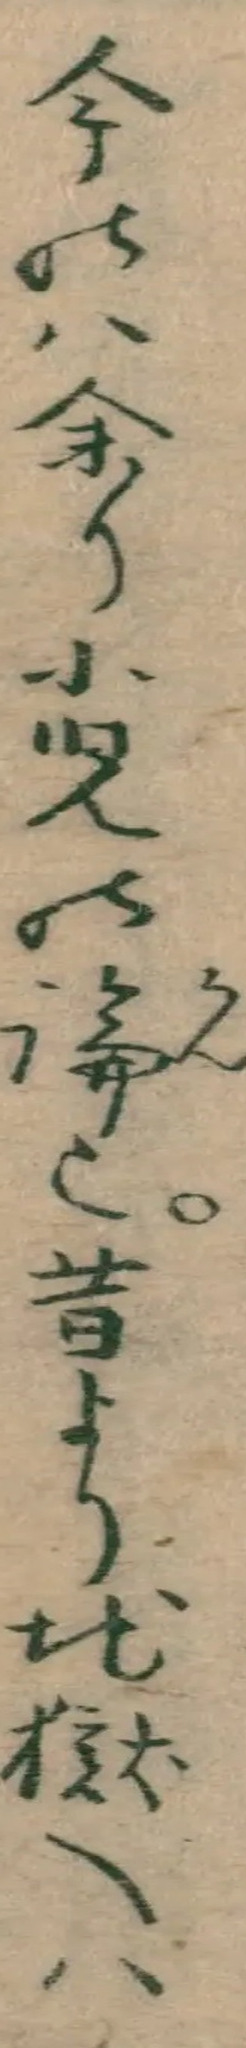今のは余り小児の論也。昔より地獄へは
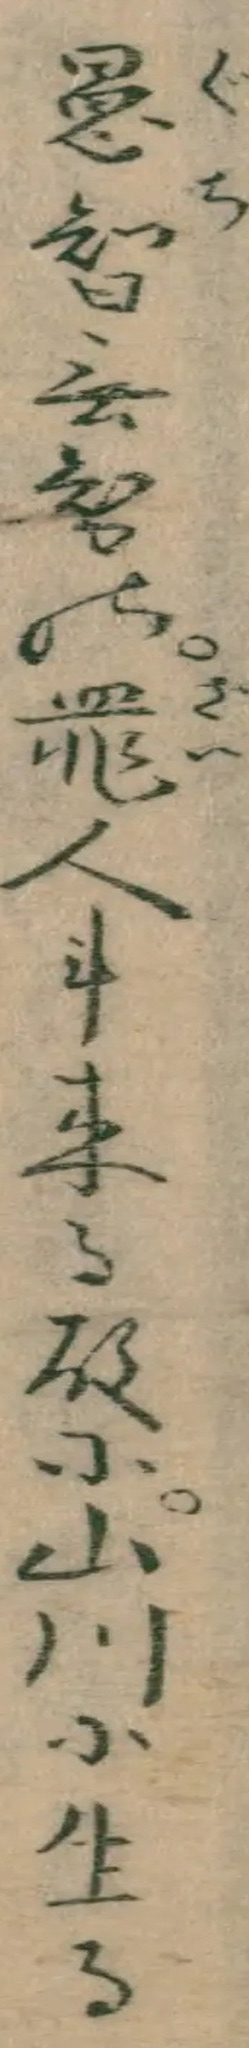愚智無智の。罪人計来る故に。山川に生る
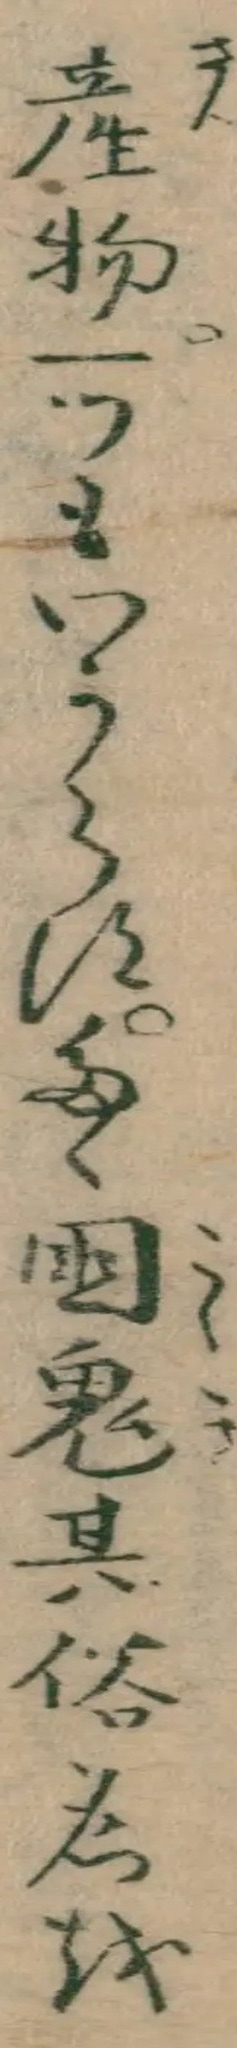産物。一ツもわからす。たゝ国鬼其俗名を
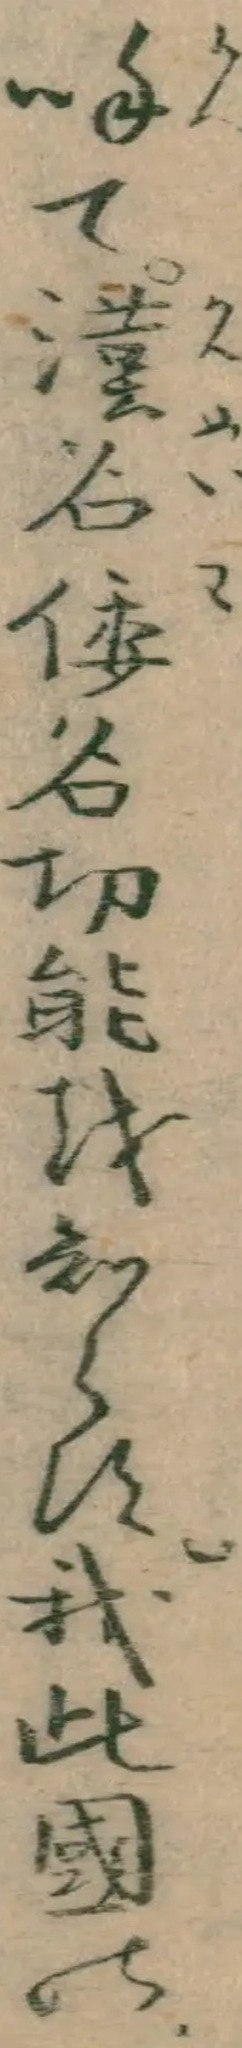呼て。漢名倭名切能をしらす。我此国の
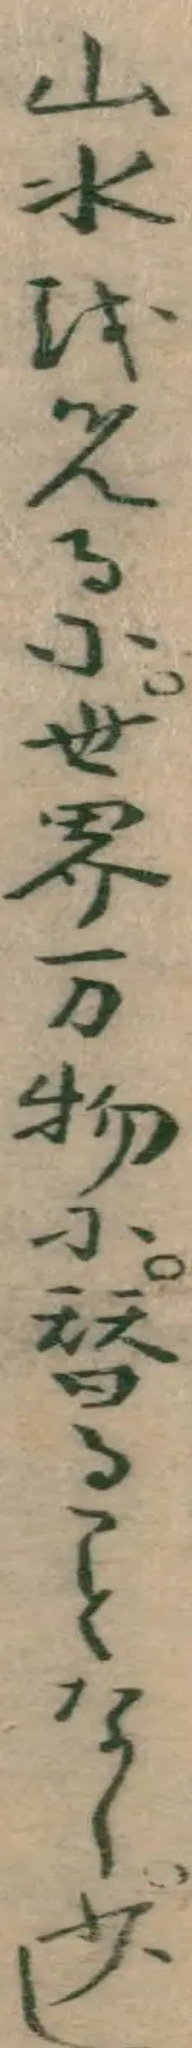山水を見るに。世界万物に。替ることなし。少し
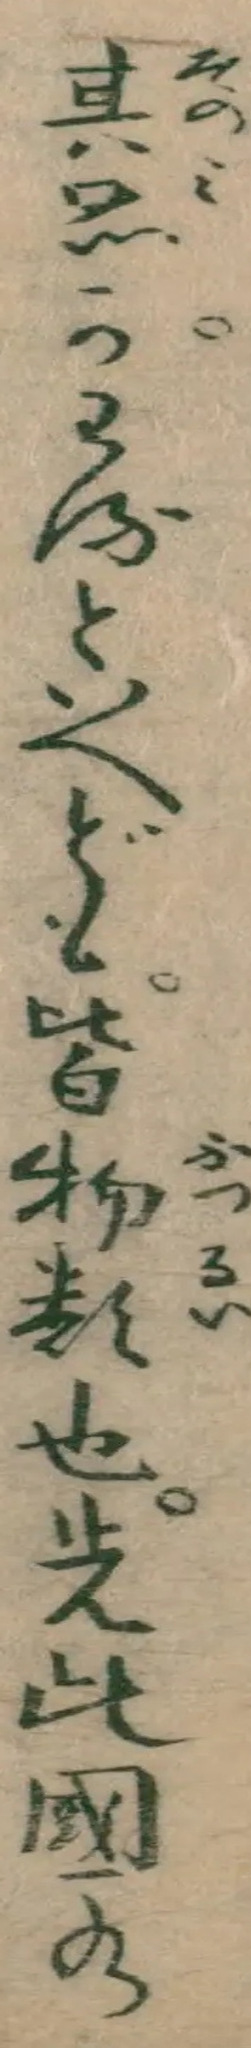其品。かわるといへども。皆物類也。先此国の
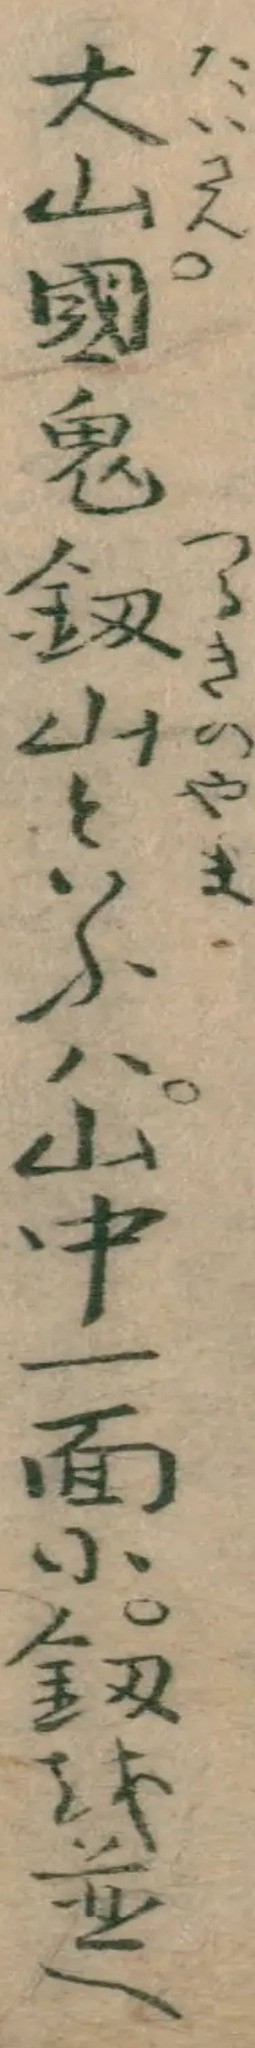大山。国鬼剣山といふは。山中一面に。剣を並へ
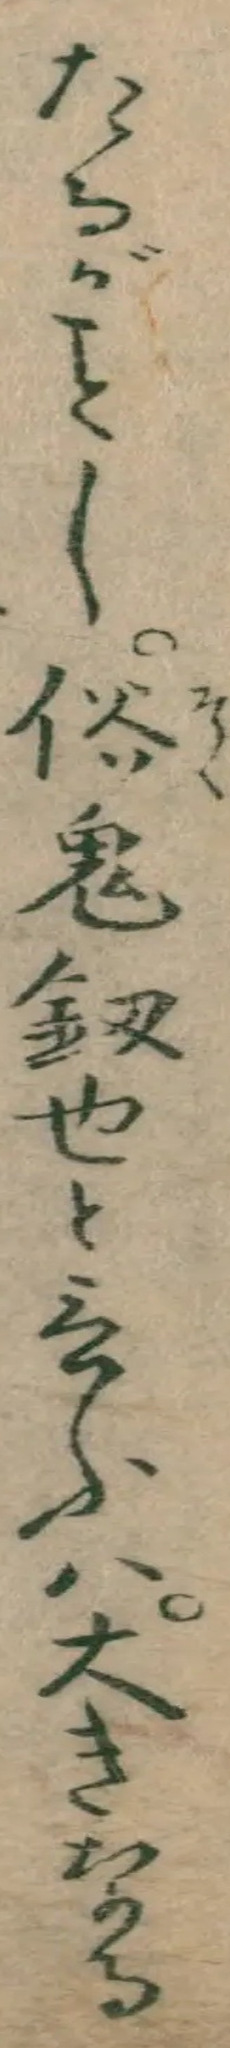たるがことし。俗鬼剣也と言ふは。大きなる
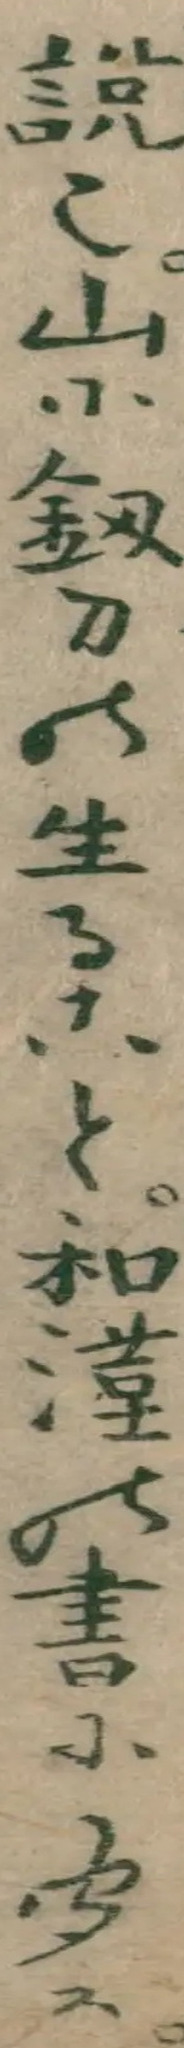誤也。山に剣刀の生ること。和漢の書に聞。

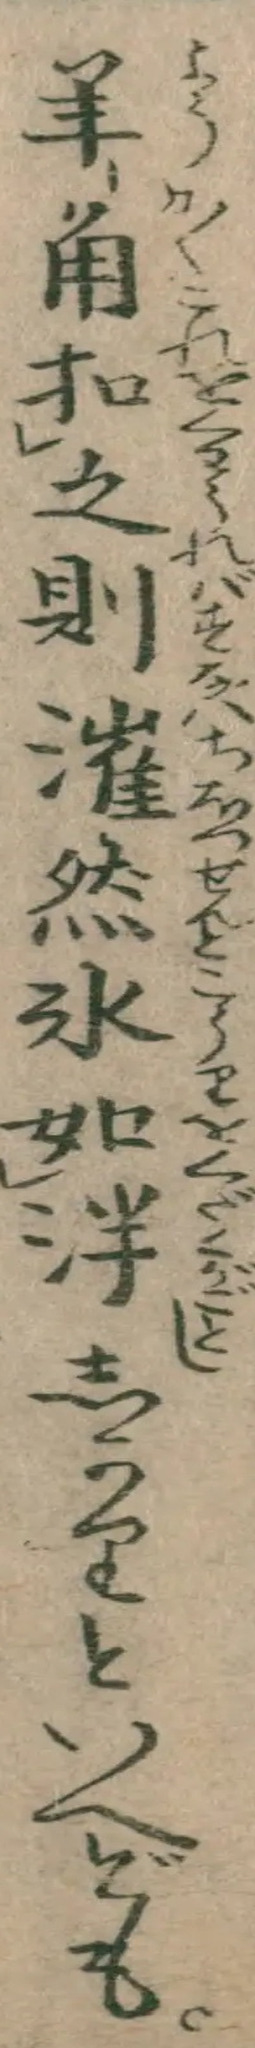羊-角扣之則漼然氷如泮しかりといへども。
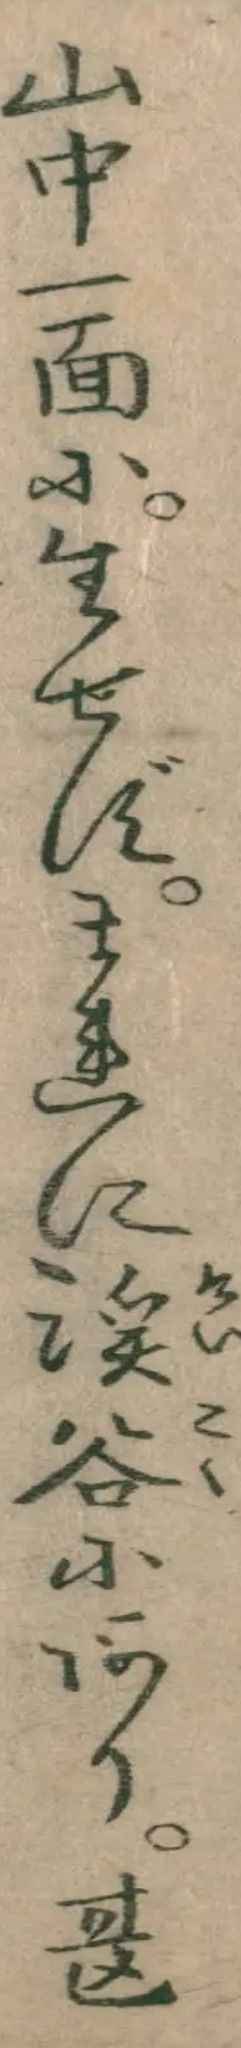山中一面に。生せず。まれに渓谷にあり。甚
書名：翻草盲目
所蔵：国立国会図書館 National Diet Library, JAPAN
